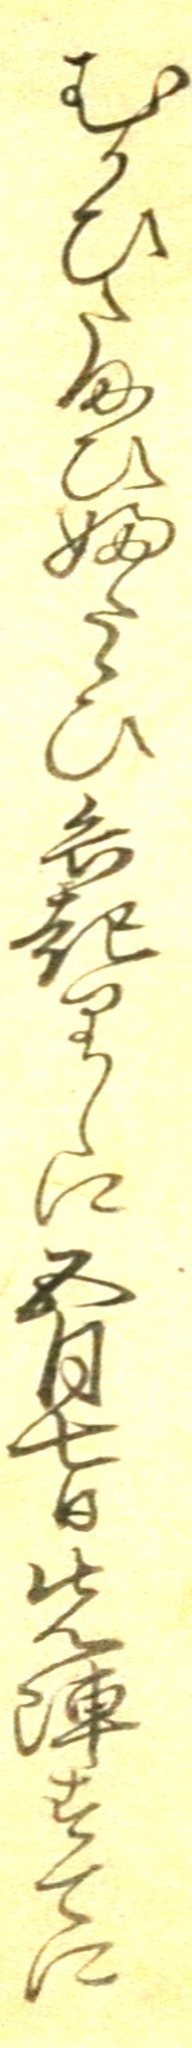むかひたまひふたゝひ兵起りしに五月七日先陣すてに
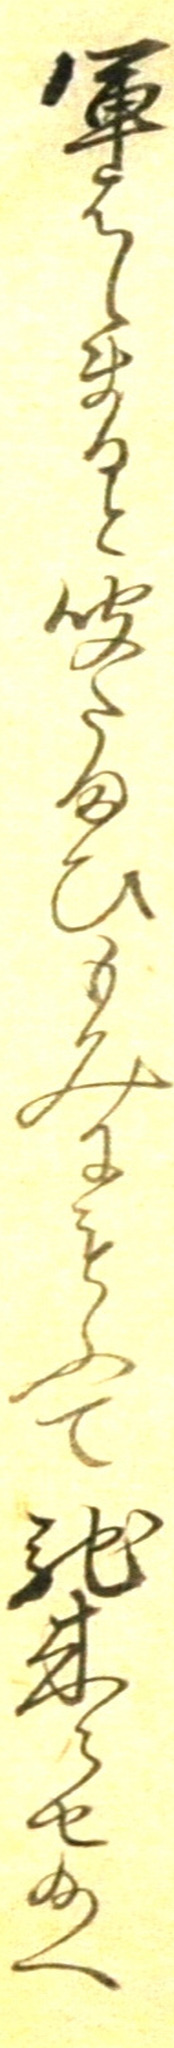軍はしまると聞たまひもみにもふて馳来らせ給へ
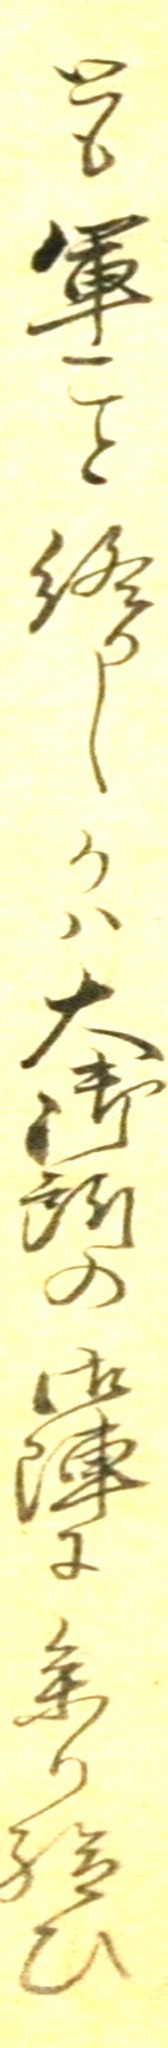とも軍こと終りしかは大御所の御陣に参り給ひ

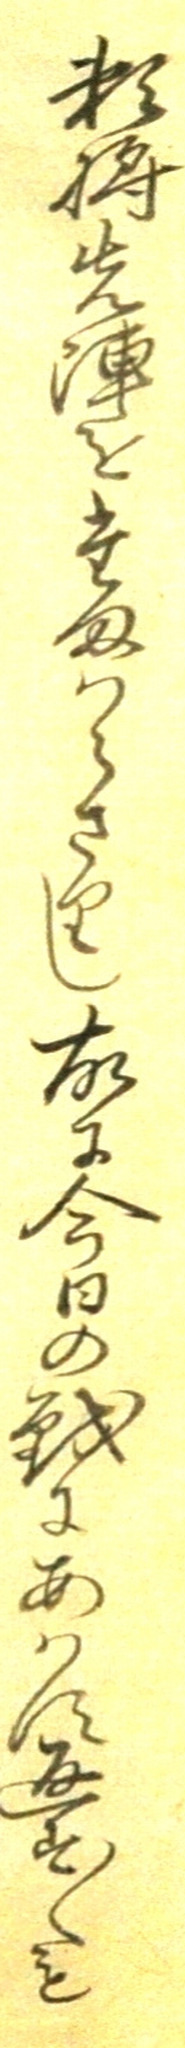頼将先陣をたまはらさりし故に今日の戦にあはす返す〳〵も
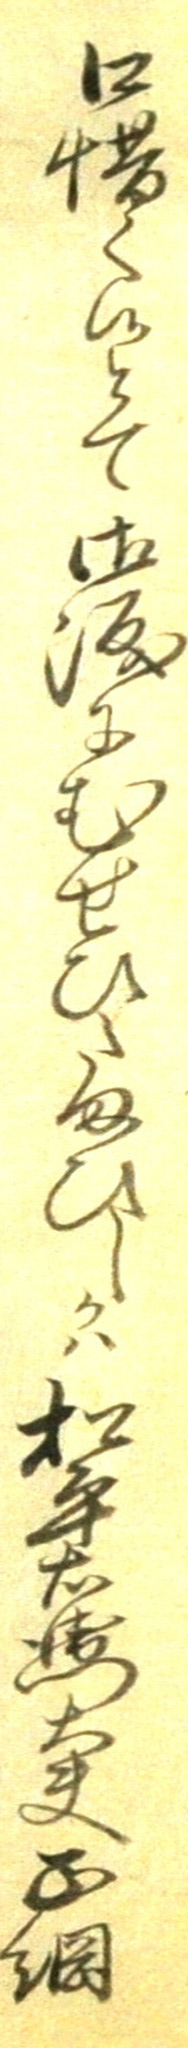口惜く候とて御涙にむせひたまひしかは松平右衛門大夫正綱
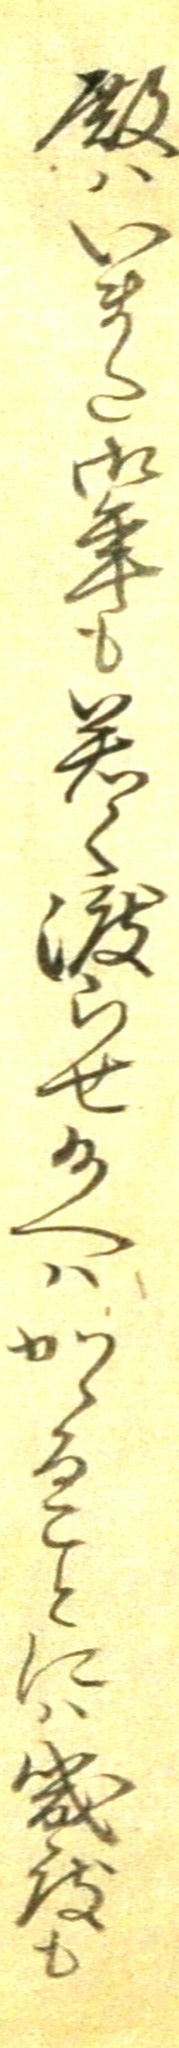殿はいまた御年も若く渡らせ給へはかゝることには幾度も
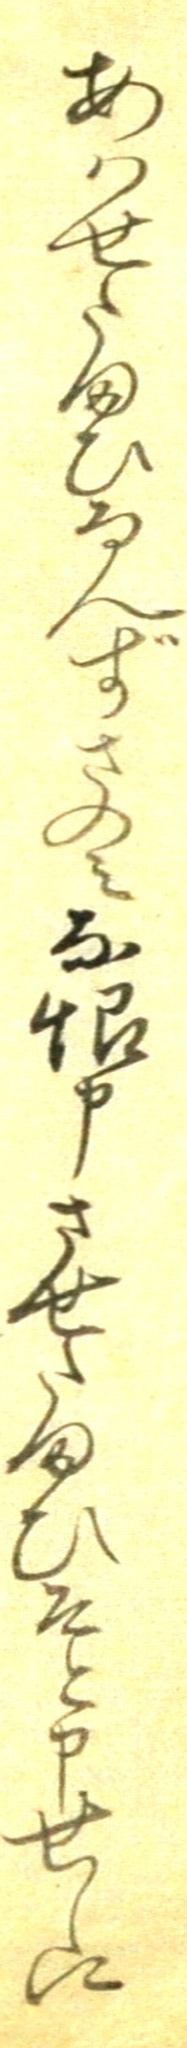あはせたまひなんずさのみな恨申させたまひそと申せしに
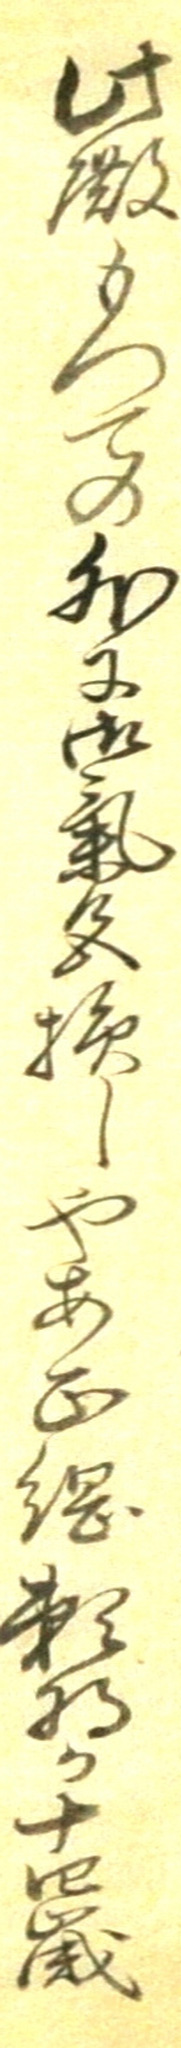此殿もつての外に御気色損しやあ正綱頼将か十四歳
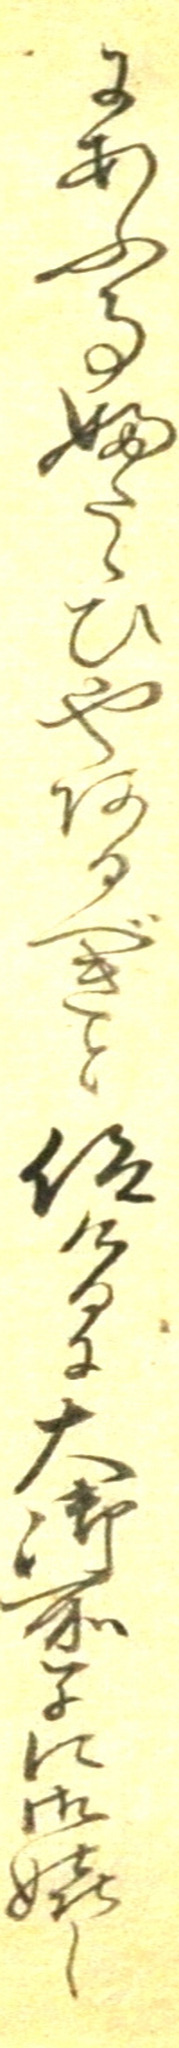にあふ事ふたゝひやあるべきと仰けるに大御所これに御嬉し
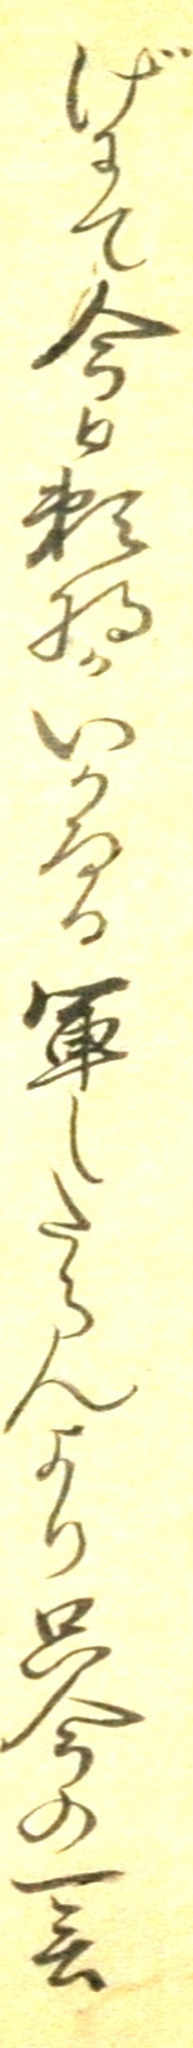げにて今日頼将かいかなる軍したらんより只今の一言
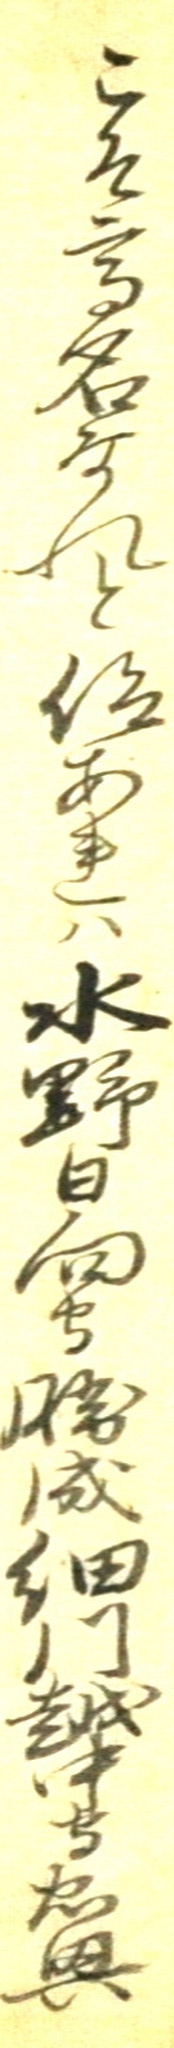こそ高名なれと仰あれは水野日向守勝成細川越中守忠興
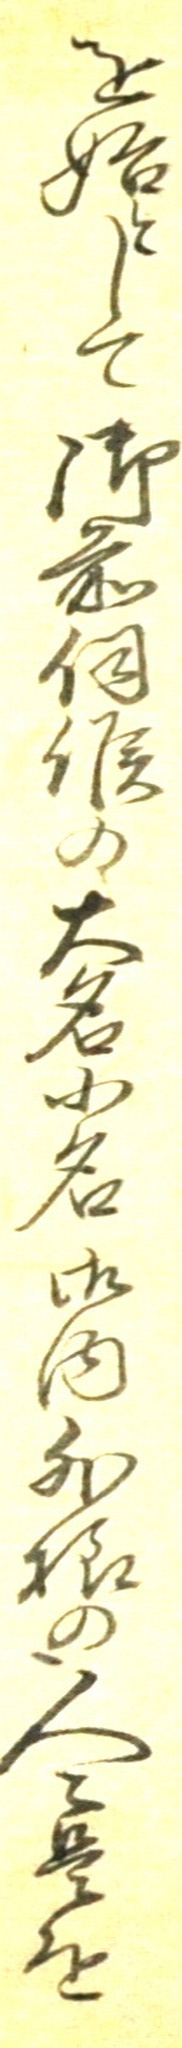を始として御前伺候の大名小名御内外様の人々是を
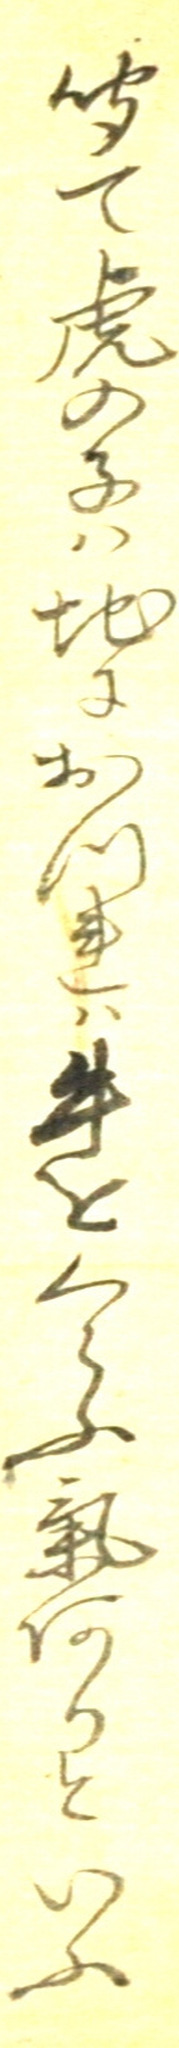聞て虎の子は地におつれは牛をくらふ気ありといふ
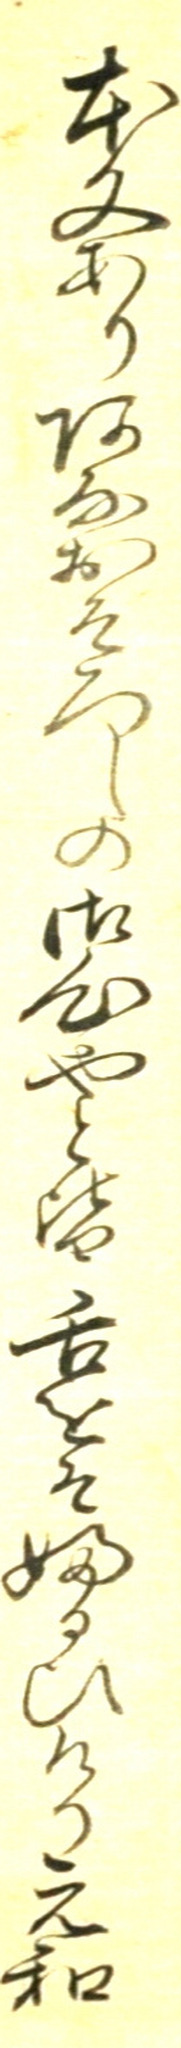本文ありあなおそろしの御心やと皆舌をそふるひけり元和
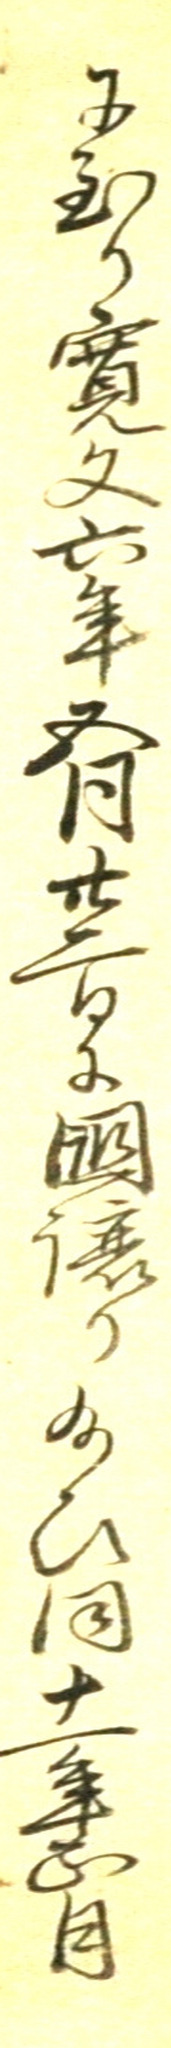に至り寛文六年五月廿二日に国譲り給ひ同十一年正月
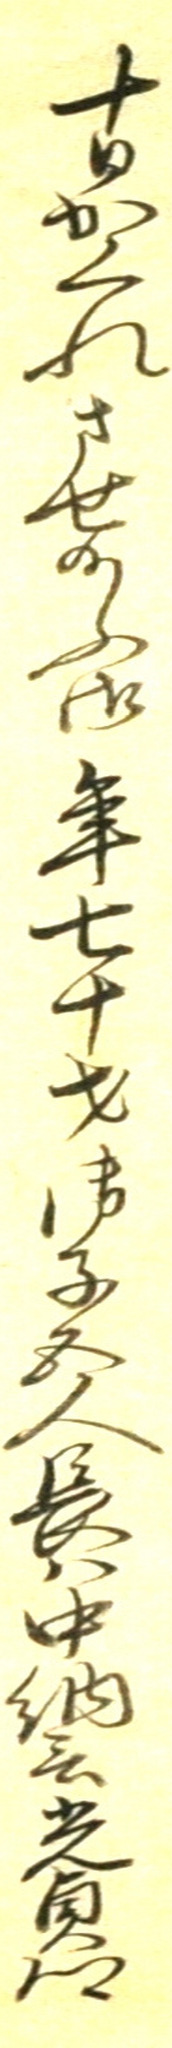十日かくれさせ給ふ御年七十才御子五人長は中納言光貞卿
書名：藩翰譜（一）
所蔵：伊那市立高遠町図書館・合同会社AMANE
